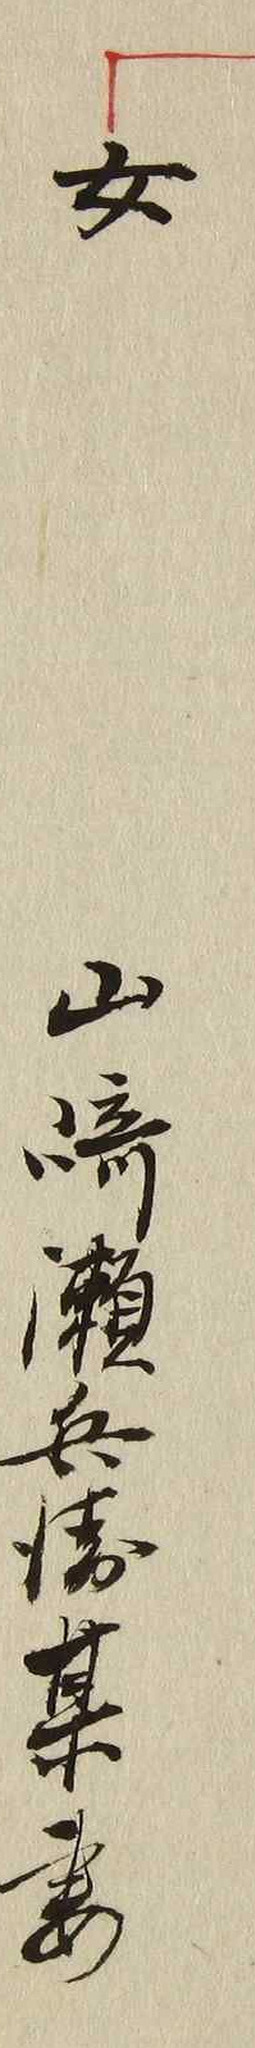女山崎瀬兵衛某妻
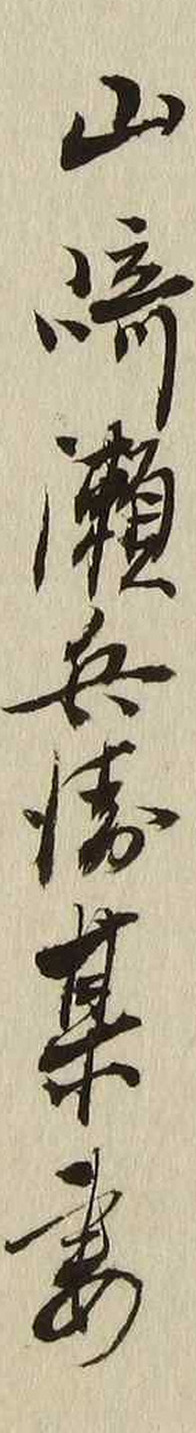女山崎瀬兵衛某妻
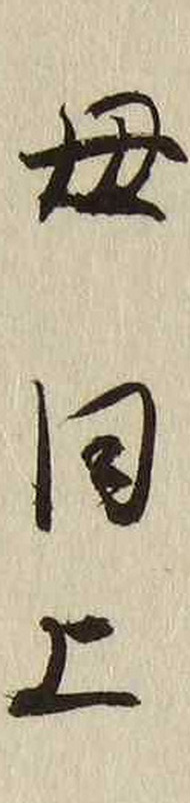母同上
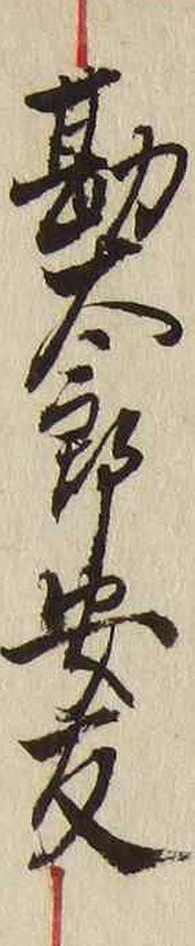勘太郎安友

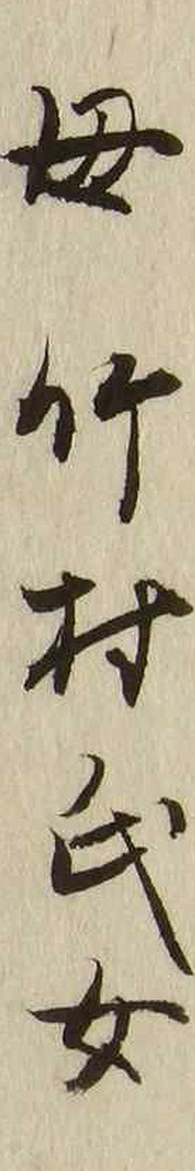母竹村氏女
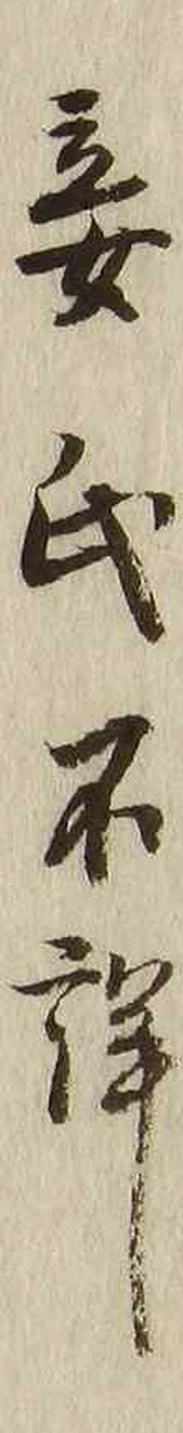妾氏不詳
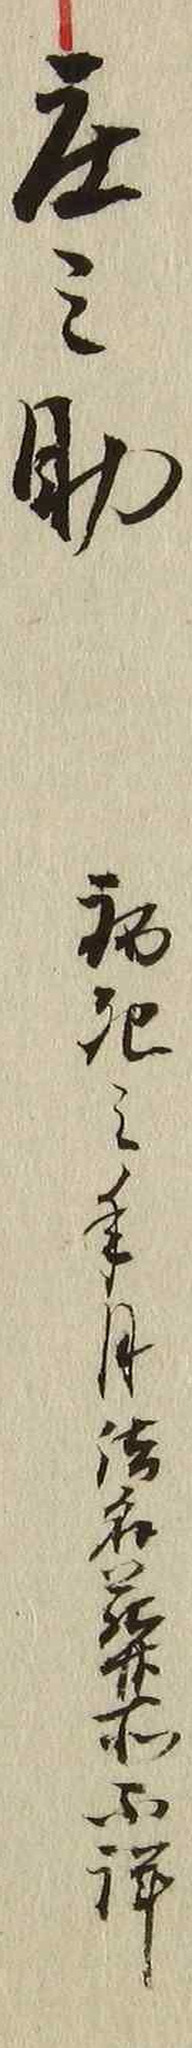庄之助病死之年月法名葬所不詳
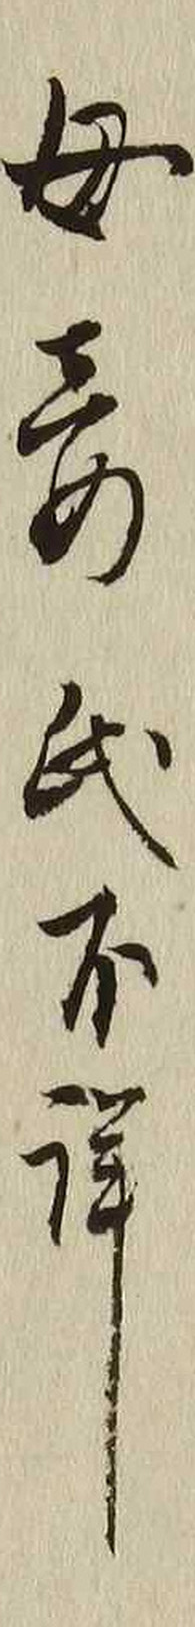母妾氏不詳
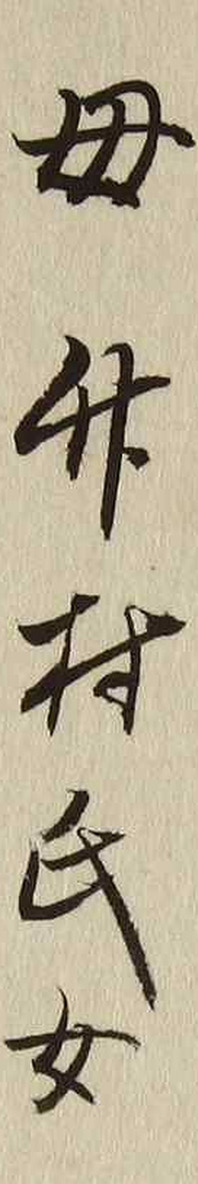母竹村氏女
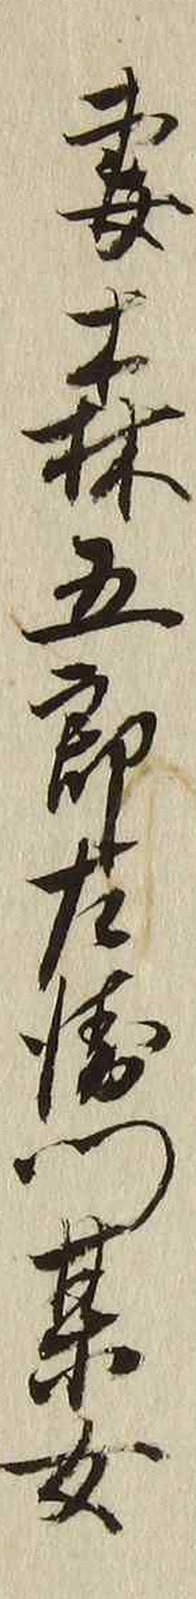妻森五郎左衛門某女
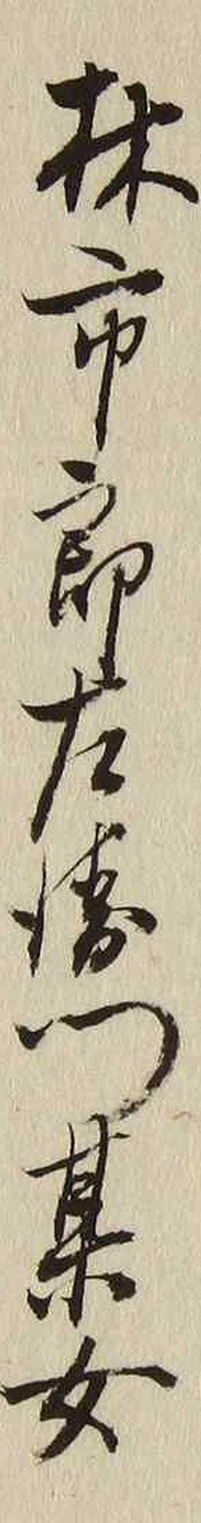林市郎左衛門某女
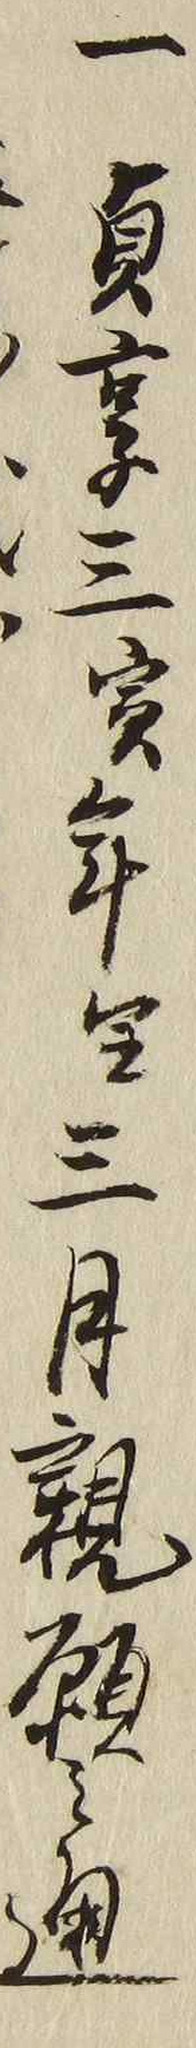一貞享三寅年閏三月親願之通
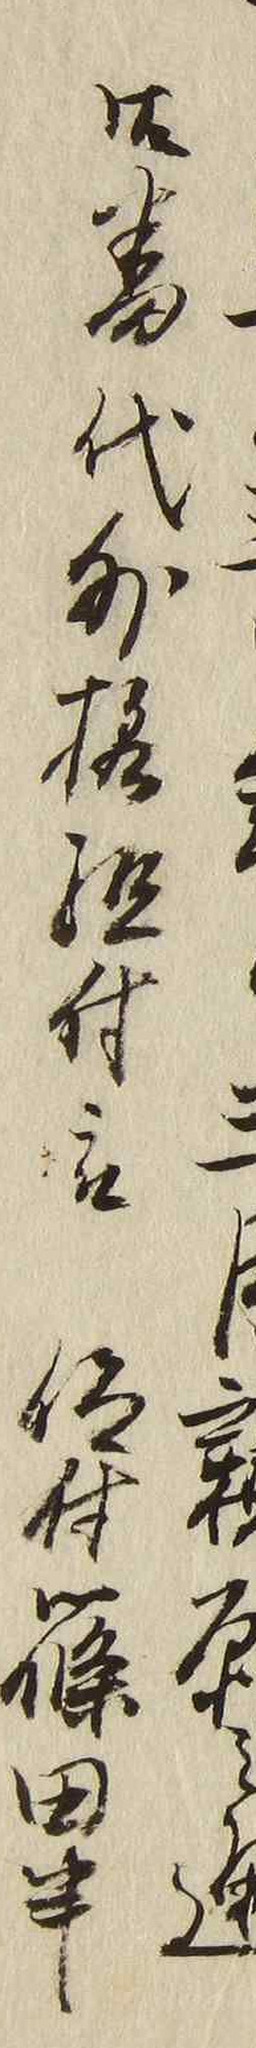御番代外様組付被仰付篠田半

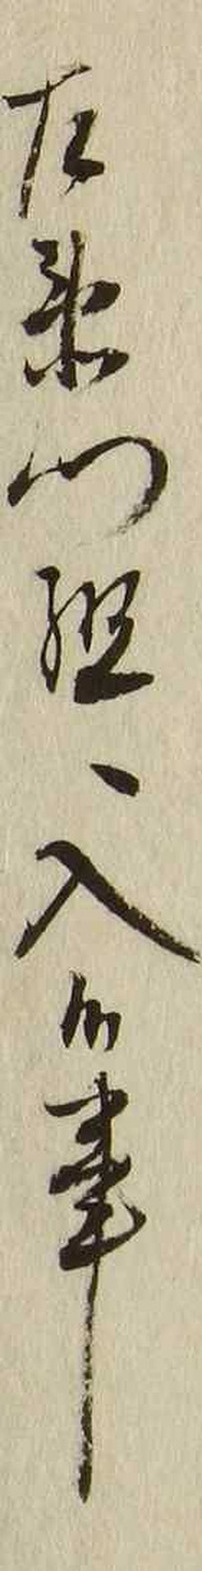左衛門組へ入候事
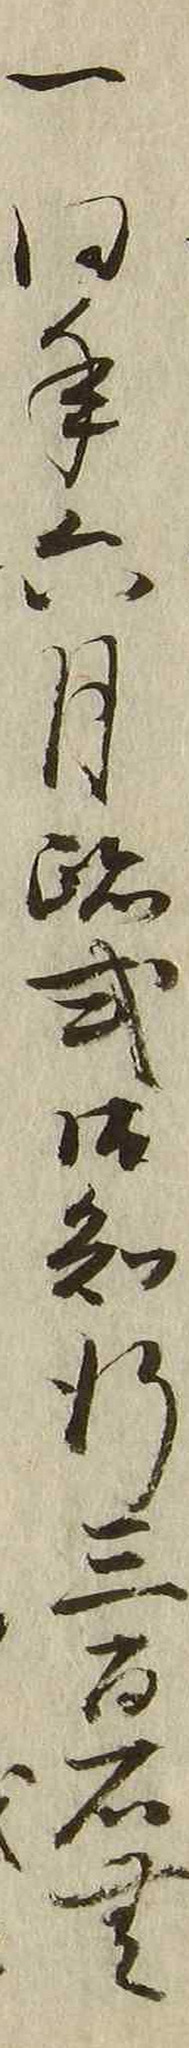一同年六月跡式御知行三百石無
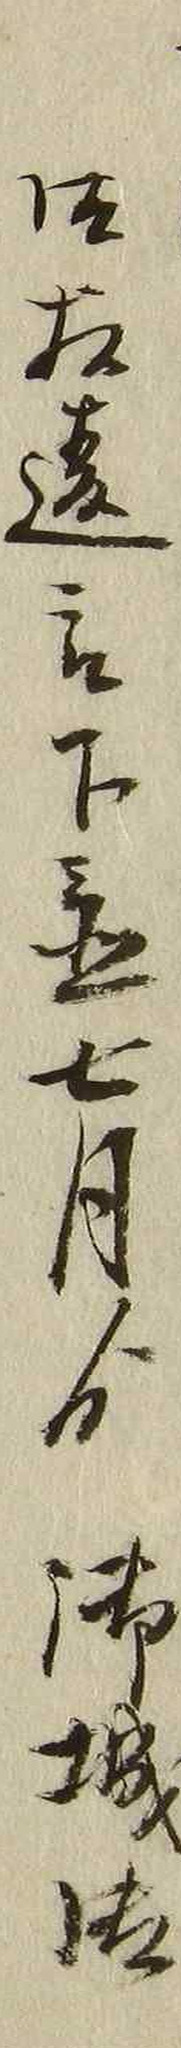御相違被下置七月ゟ御城御
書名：諸士系譜　巻之348　も之部4
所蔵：会津若松市立会津図書館
